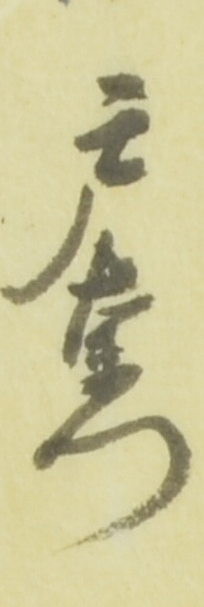戸右衛門
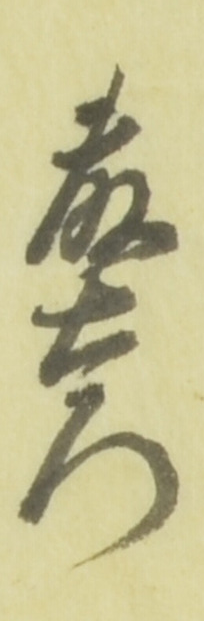戸右衛門
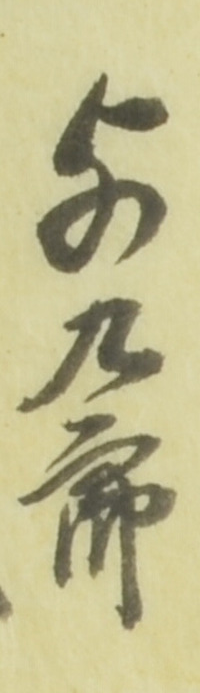与九郎
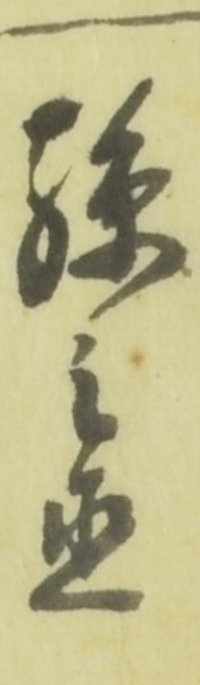孫之丞
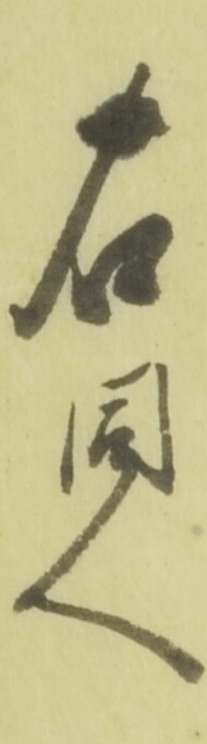右同人
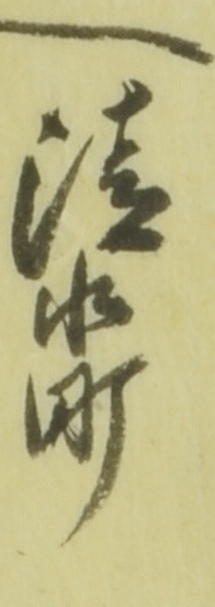清水町
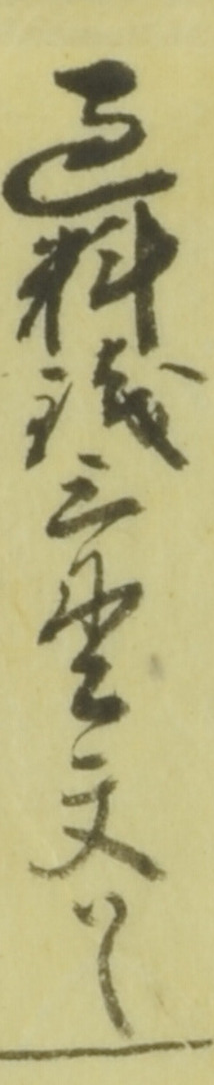過料銭三貫文ツヽ
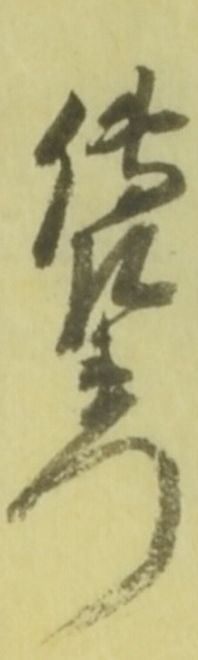伝左衛門

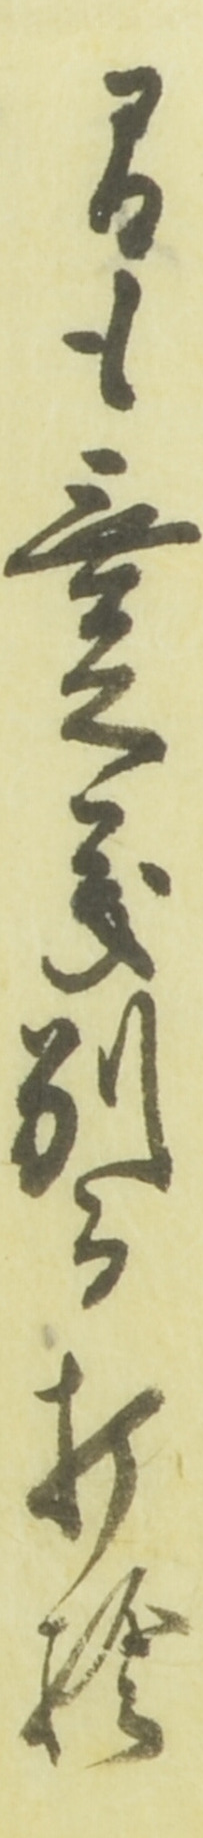間も無之義別而打捨
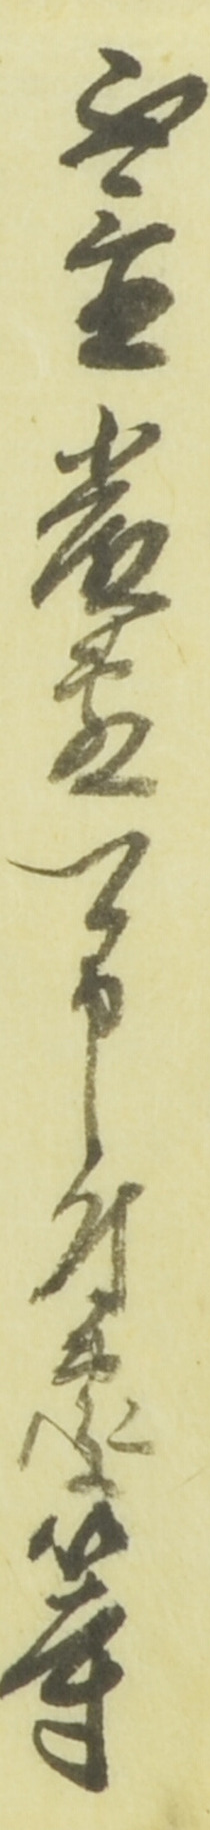不置厳敷可申付処等
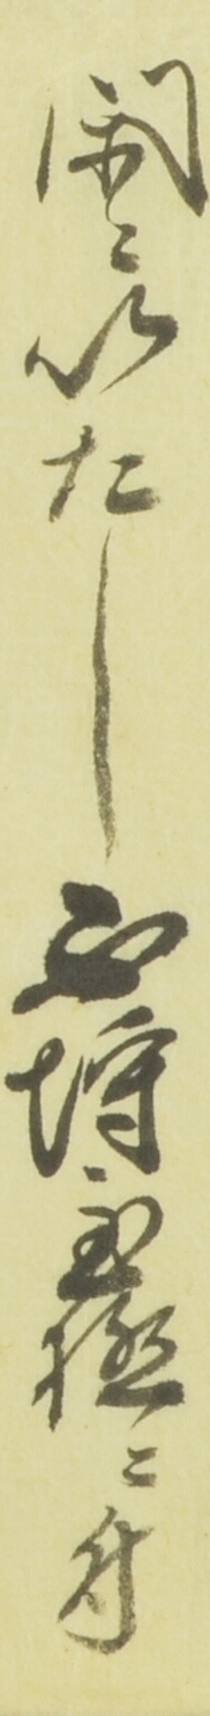閑ニいたし不埒至極ニ付
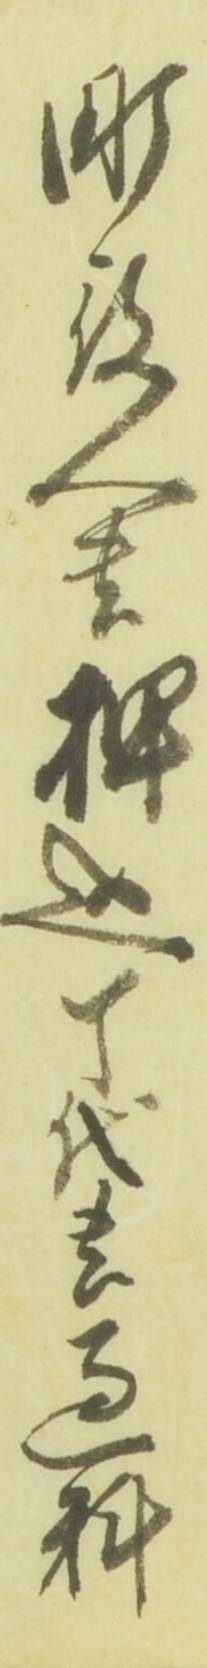町役人共押込丁代共過料
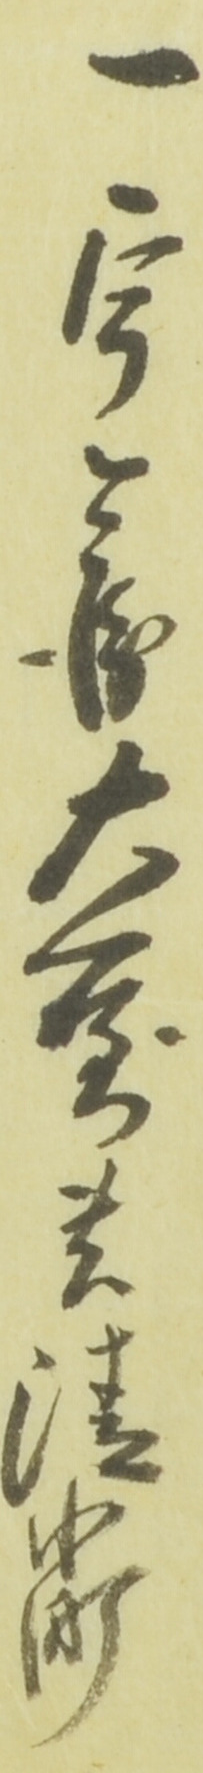一宇兵衛大屋共清水町
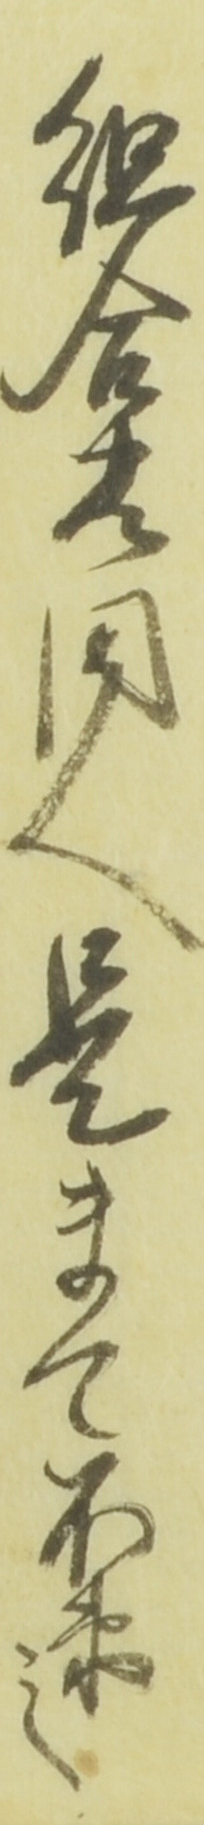組合共同人是まて不束之
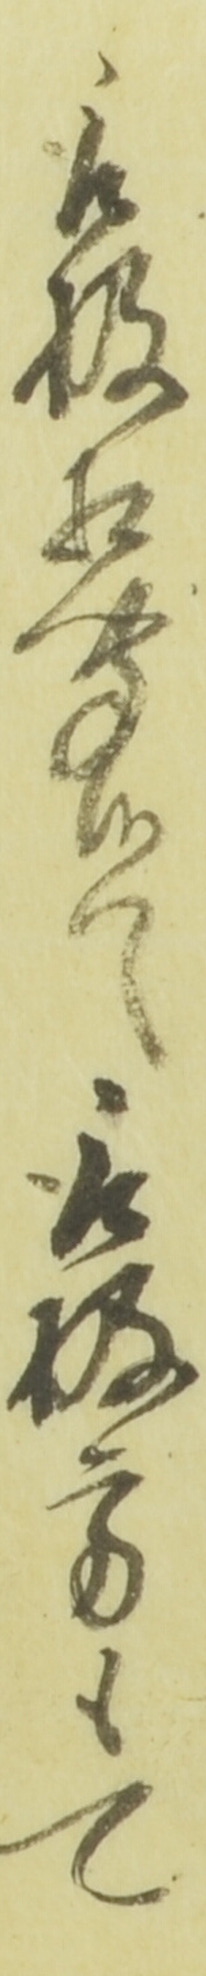取扱相聞候ハヽ取扱方も可
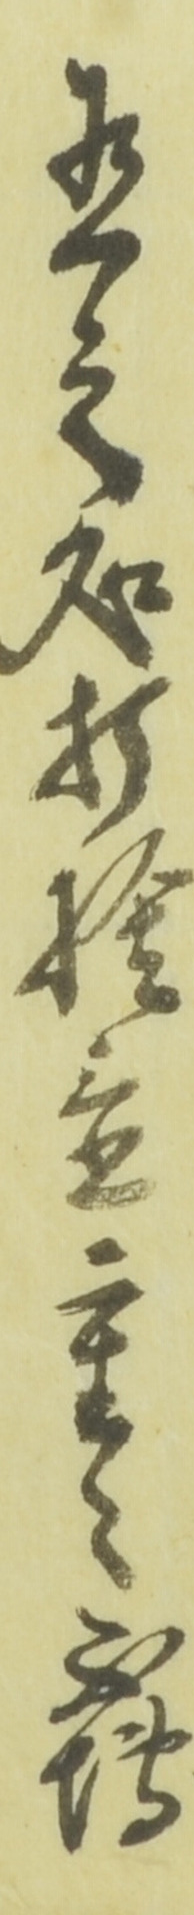有之処打捨置重々不埒
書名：御触書御書附控
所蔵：伊那市立高遠町図書館・合同会社AMANE
